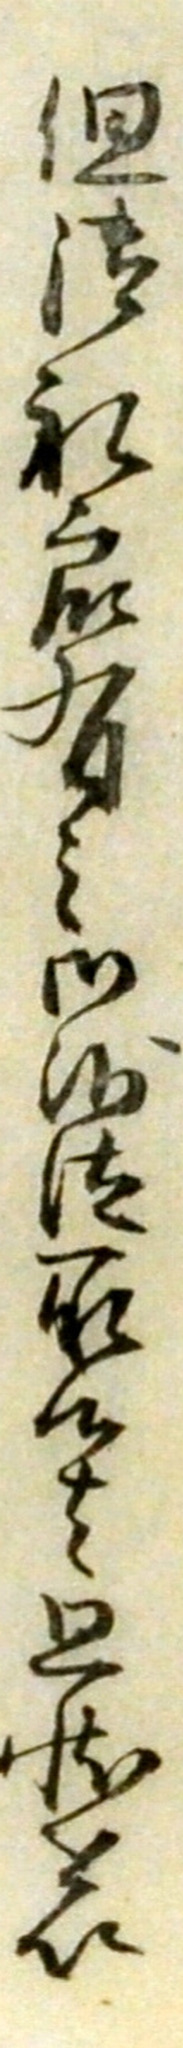但御礼衆有之御沙汰承候は廻状を以
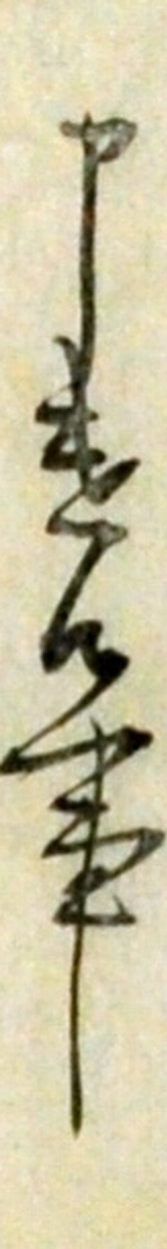申遣候事

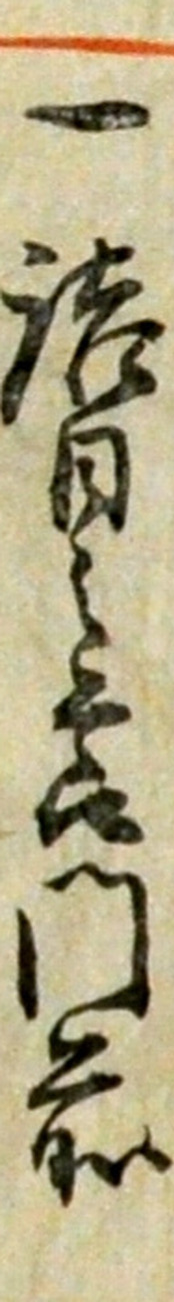一詰日之節門前
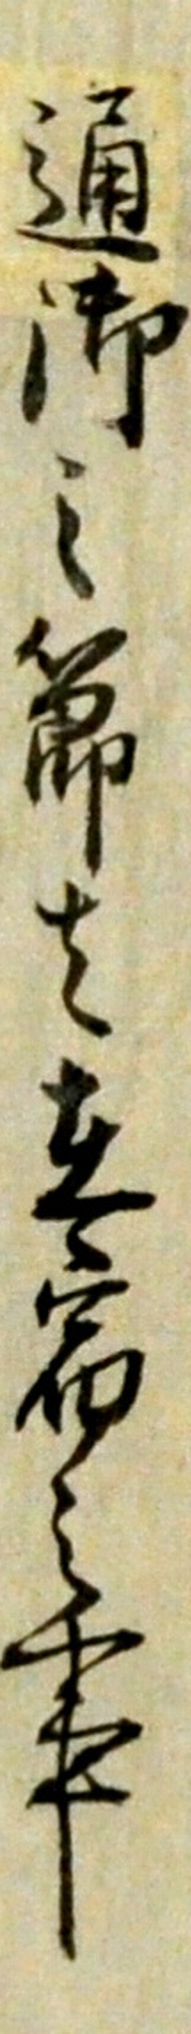通御之節は在宿之事
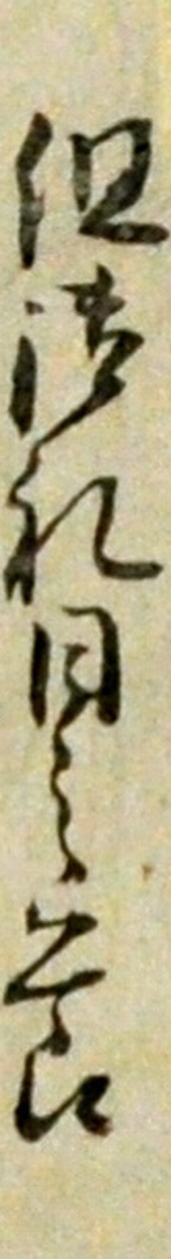但御礼日之節
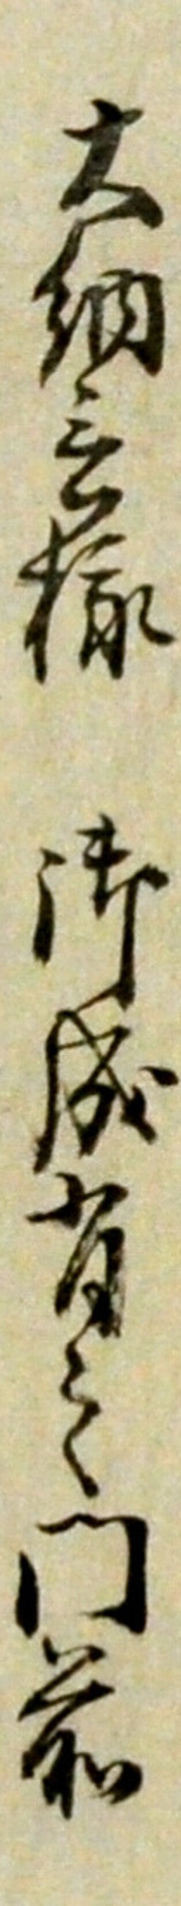大納言様御成有之門前
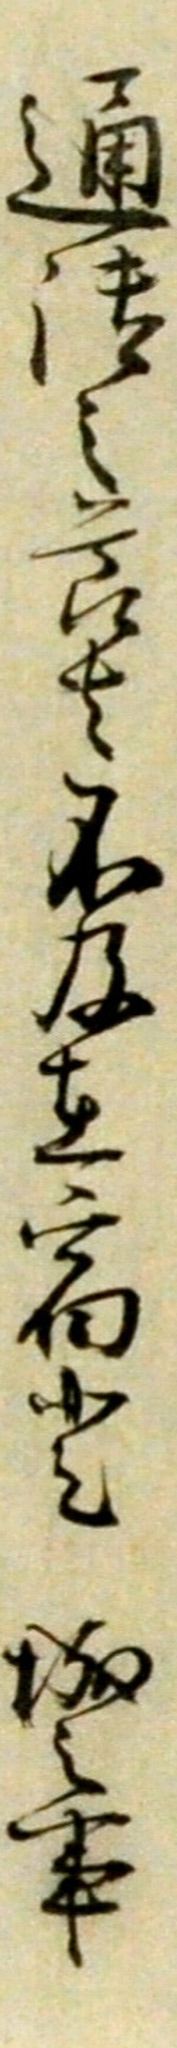通御之節は不及在宿登城之事
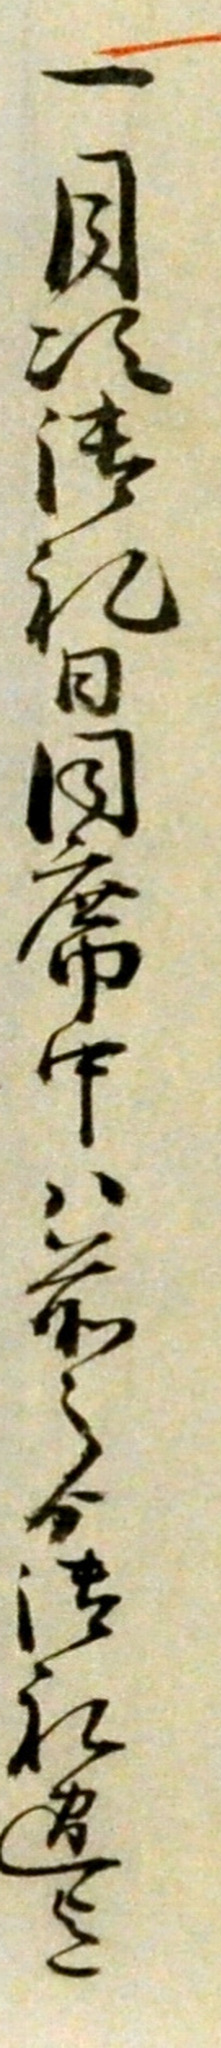一月次御礼日同席中は前々ゟ御礼過迄
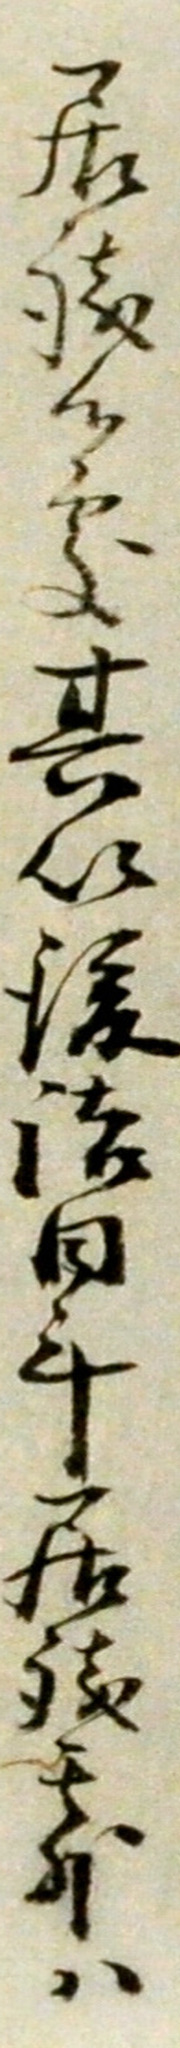居残候処其以後詰日斗居残其外は
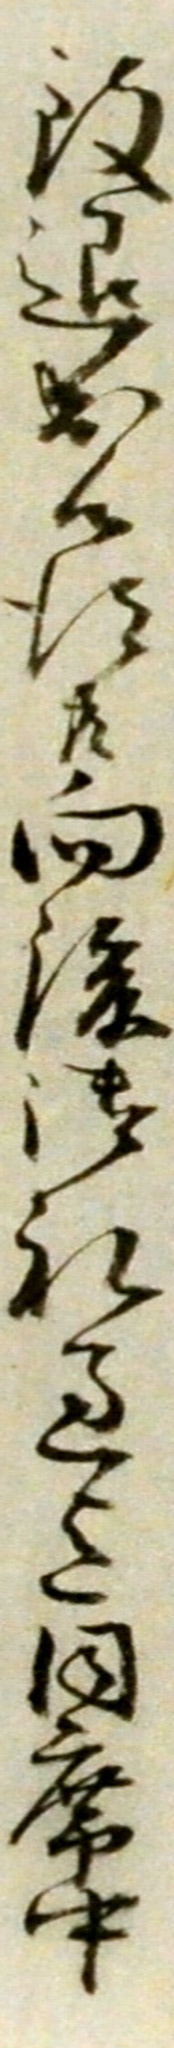致退出候得共向後御礼過迄同席中
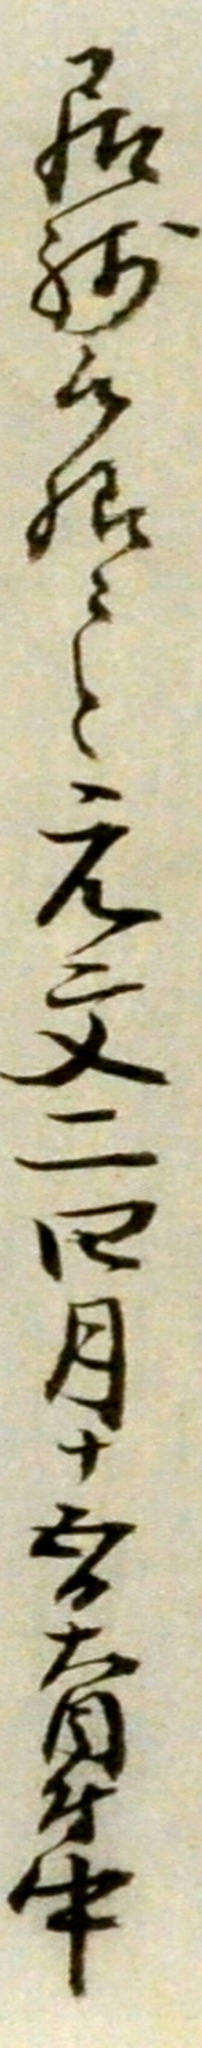居残候様にと元文二四月十五日大目付中
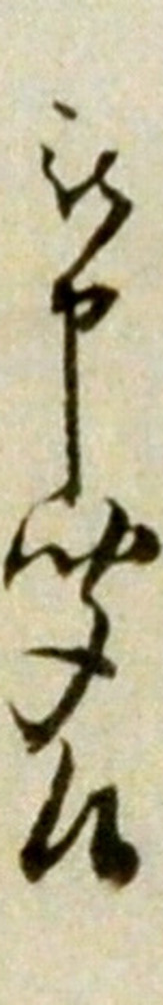被申聞候
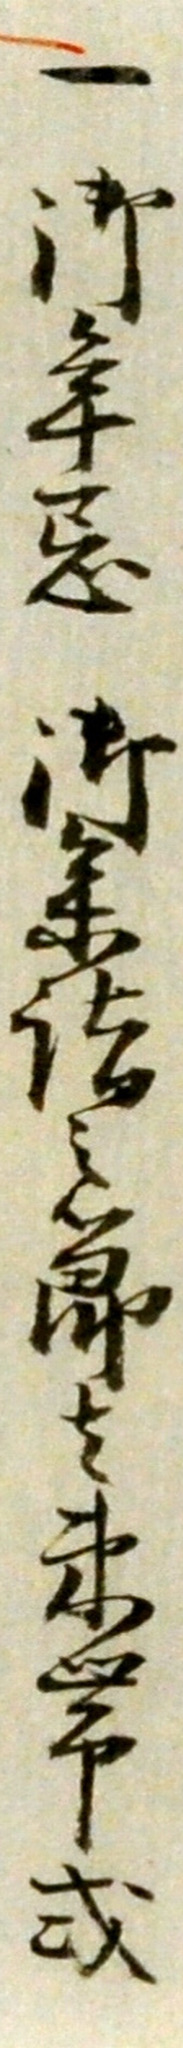一御年忌御参詣之節は束帯或
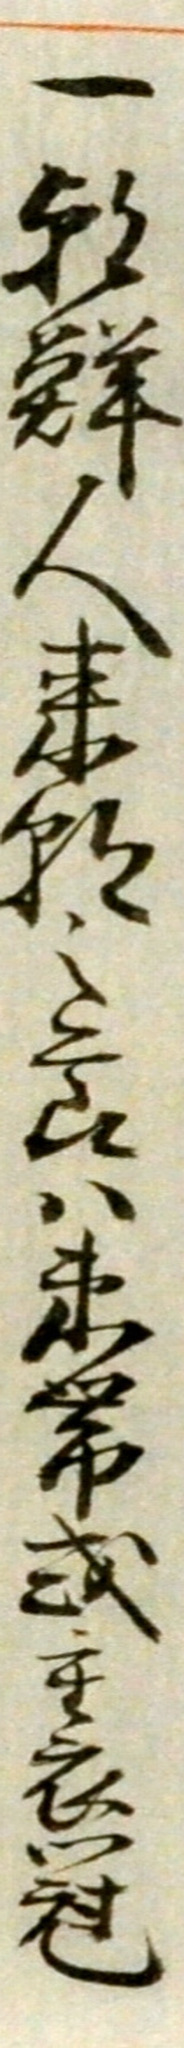一朝鮮人来朝之節は束帯或衣冠
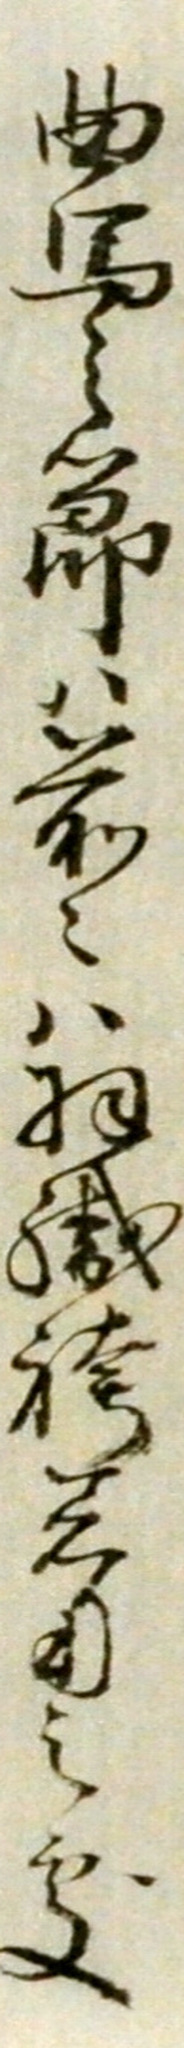曲馬之節は前々は羽織袴着用之処
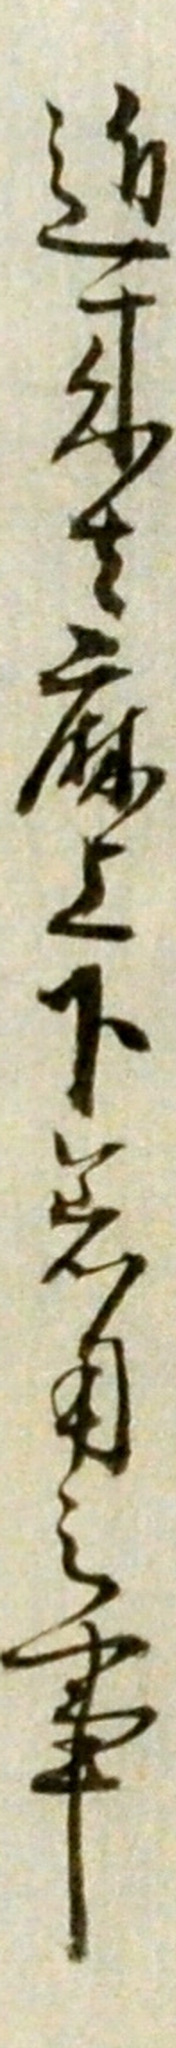近来は麻上下着用之事
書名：申合帳〔一括〕
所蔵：伊那市立高遠町図書館・合同会社AMANE
